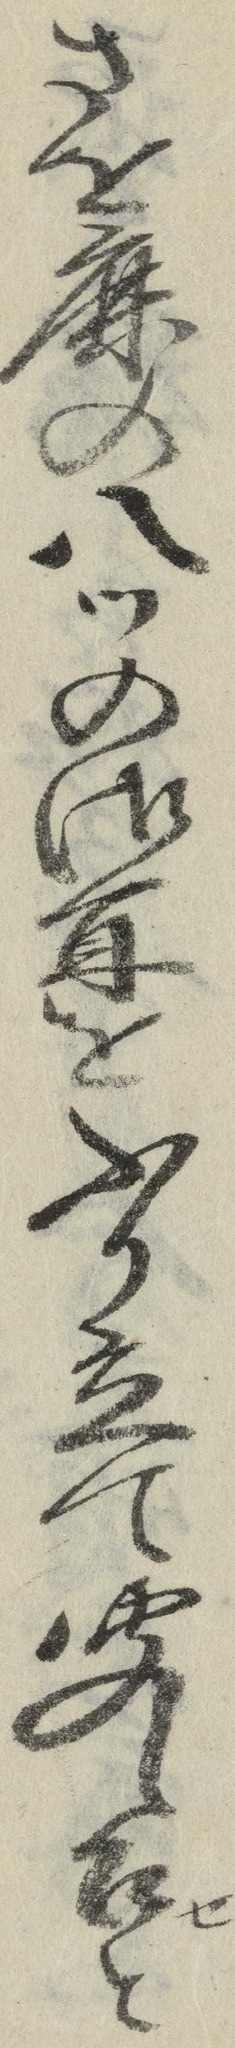さを鹿の八ツの御耳をふり立て聞し召
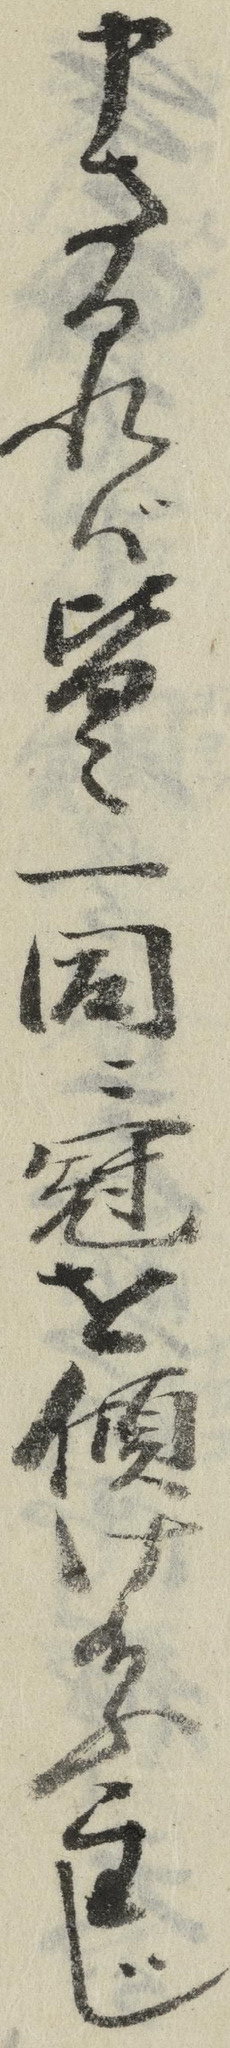申さるれば皆々一同に冠を傾け給ふ主じ

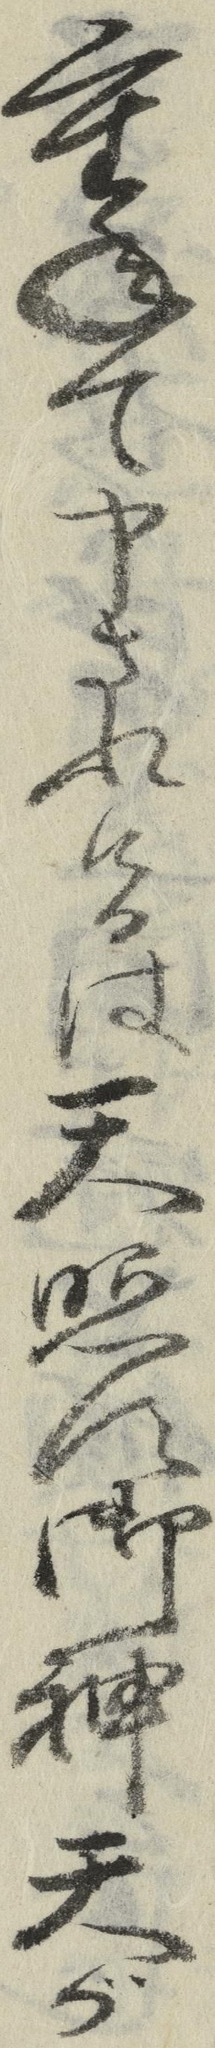重ねて申されけるは天照須御神天が
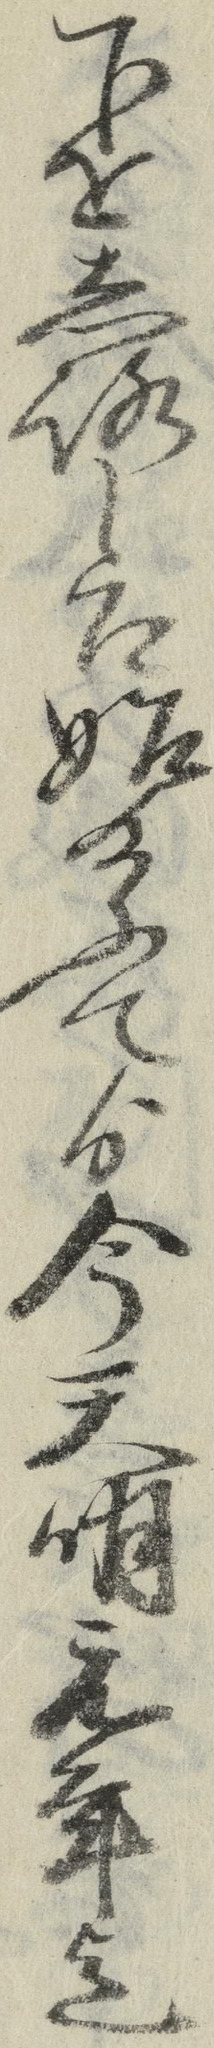下をしろし召始給ふてゟ今天明元年迄
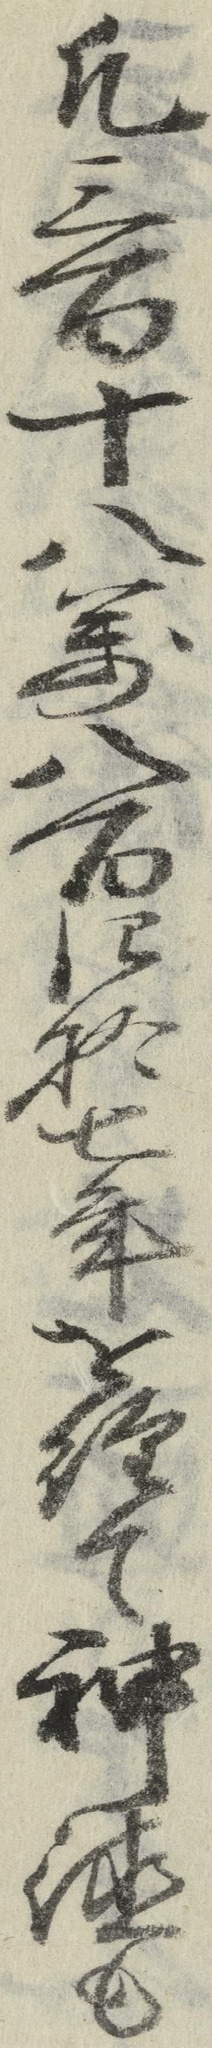凡三百十八萬八百四拾七年を経て神徳も
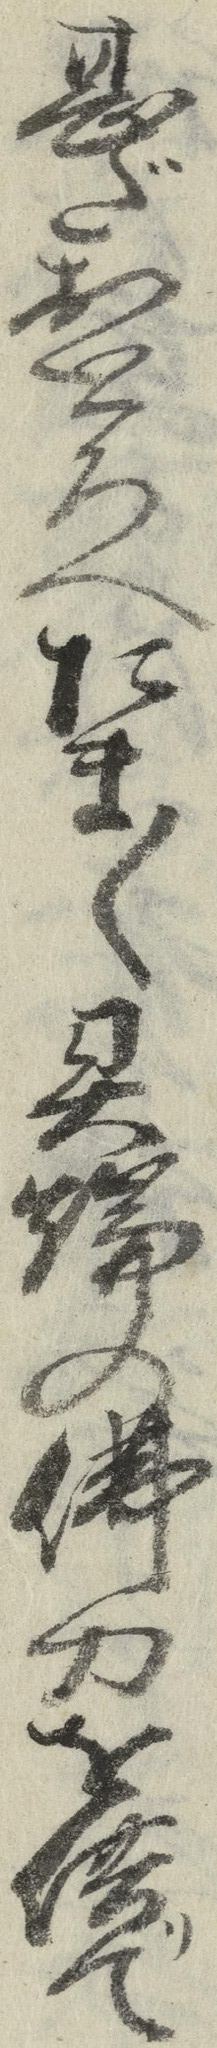甚だおとろへたま〳〵異端の佛力を借
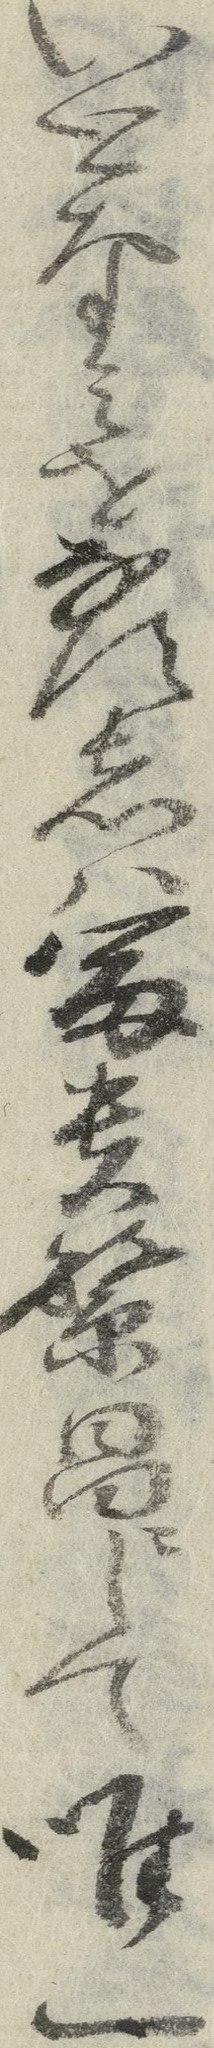いとなみをなす者は富貴繁昌にして唯一
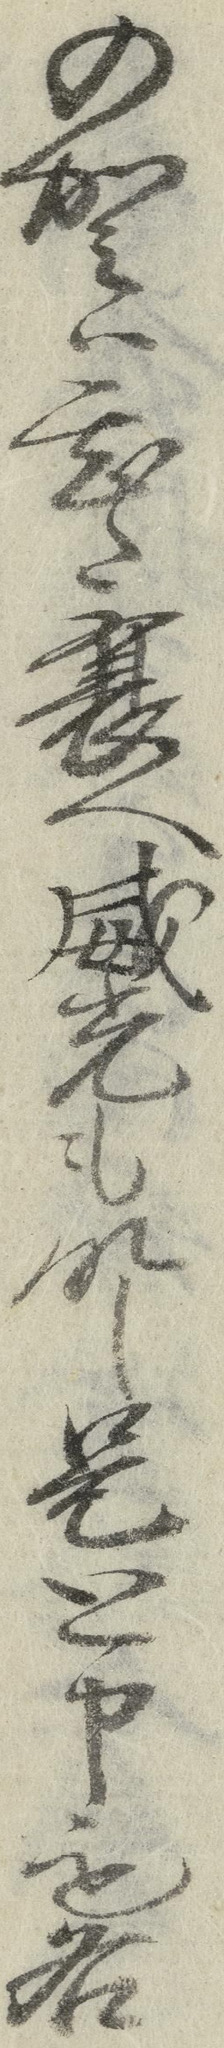のかみは甚た衰へ威光もなし是と申も各
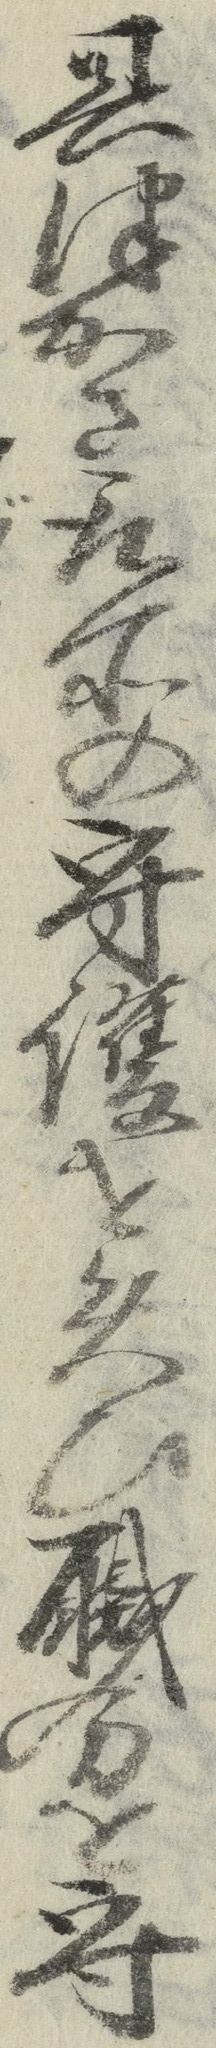其つかさ取所の守護を失ひ職分を守
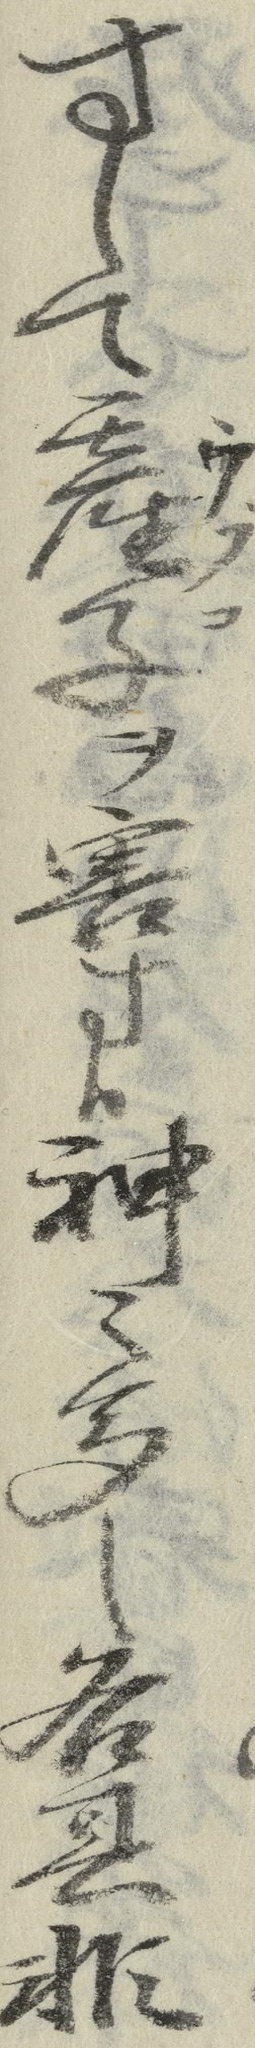すして産子ヲ害する神々多し各其非
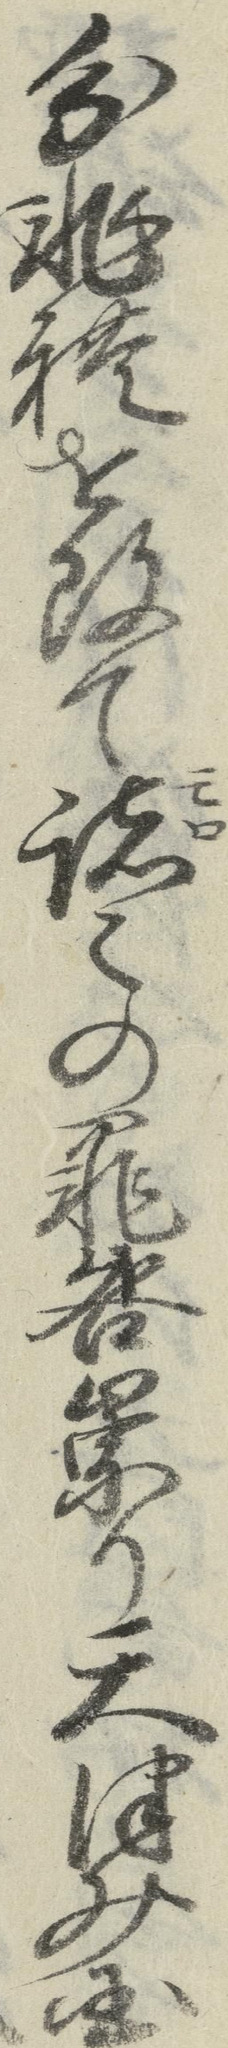分非礼を改て諸々の罪咎祟り天つみ国
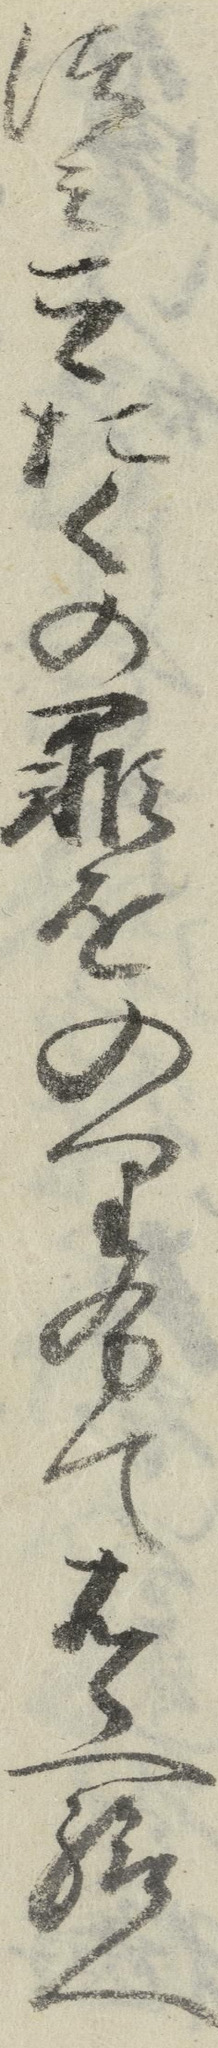つみこゝたくの罪をのり分てはらへ給へ
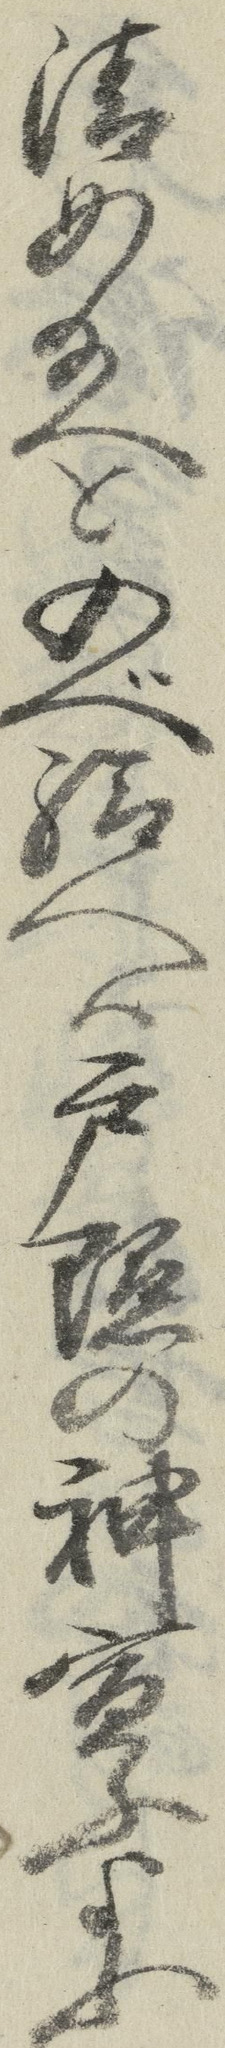清め給へとのべ給へは戸隠の神宣ふよふ
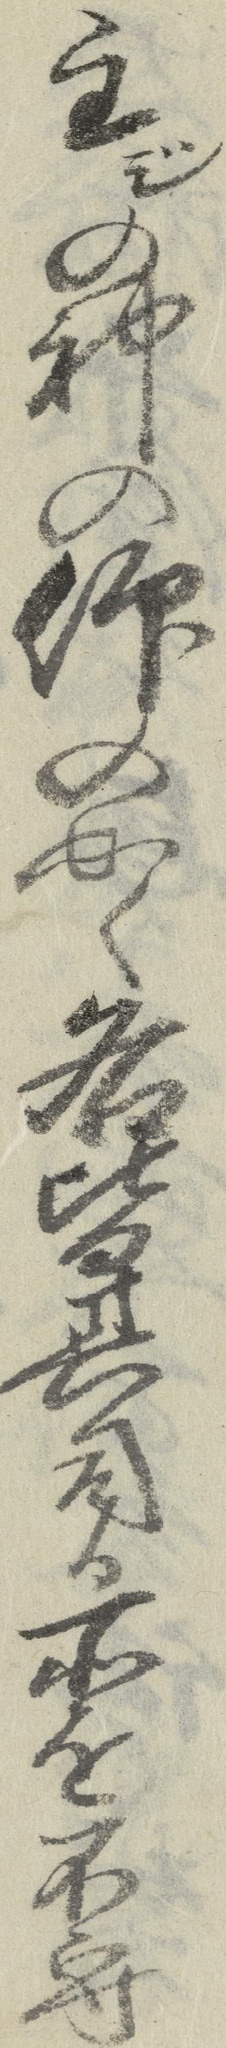主神の仰の如く各皆其司る所を不守
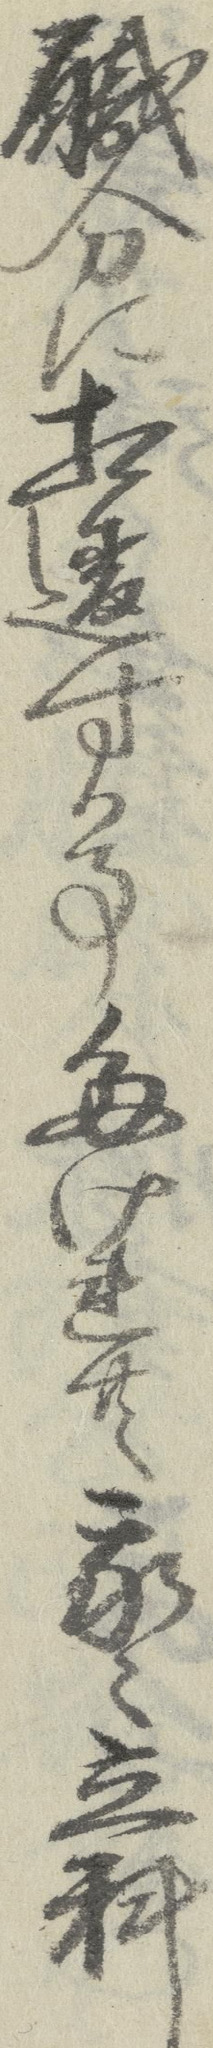職分に相違する事多けれ共我々立科
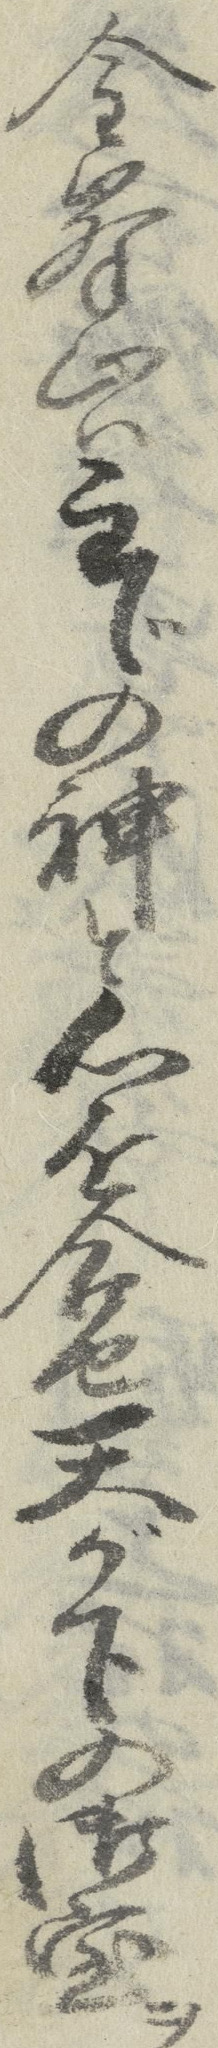金峯山は主じの神と心を合セ天が下の御宝
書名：浅間大焼騒動記　上
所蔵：東京大学地震研究所図書室 Earthquake Research Institute Library, The University of Tokyo, JAPAN
